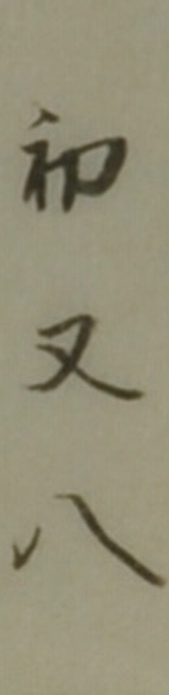初又八
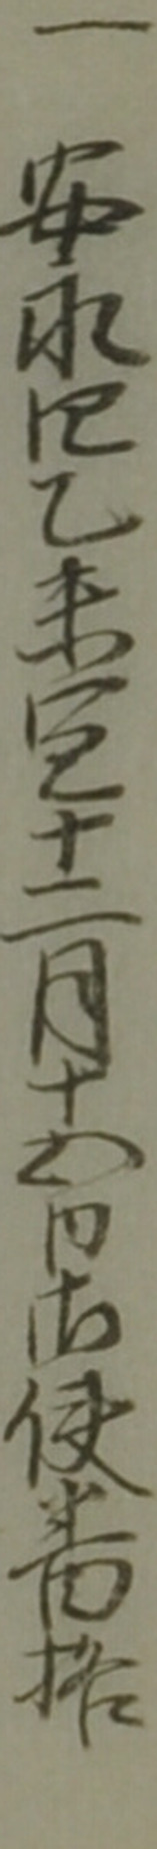一安永四乙未閏十二月十五日御使番格
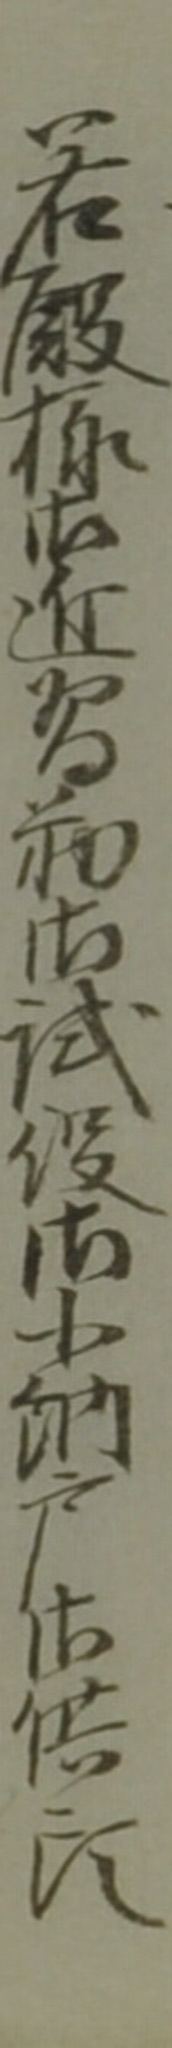若殿様御近習勤御試役御小納戸御供頭
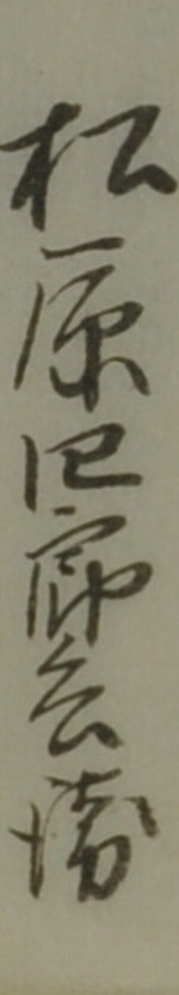松原四郎兵衛
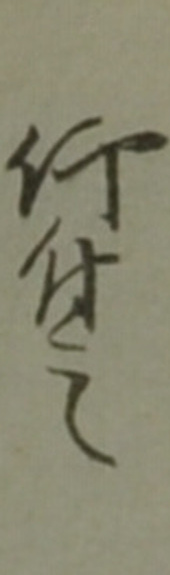仰付之
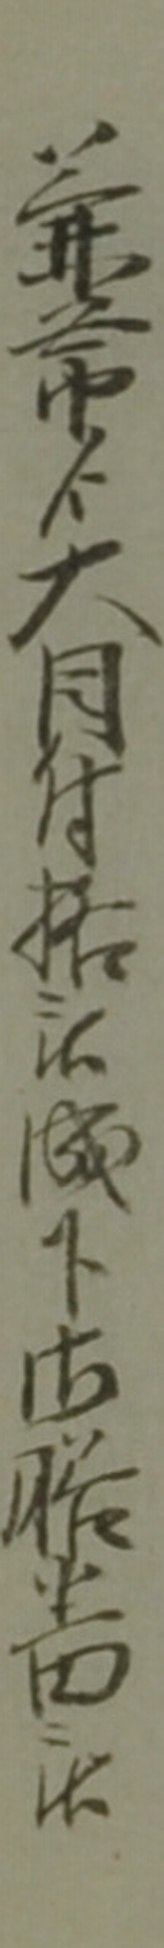兼帯ゟ大目付格被成下御膳番被
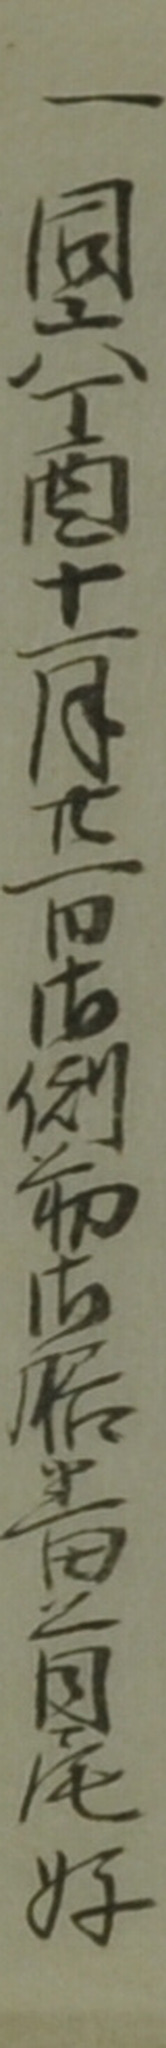一同六丁酉十一月廿一日御側勤御膳番首尾好
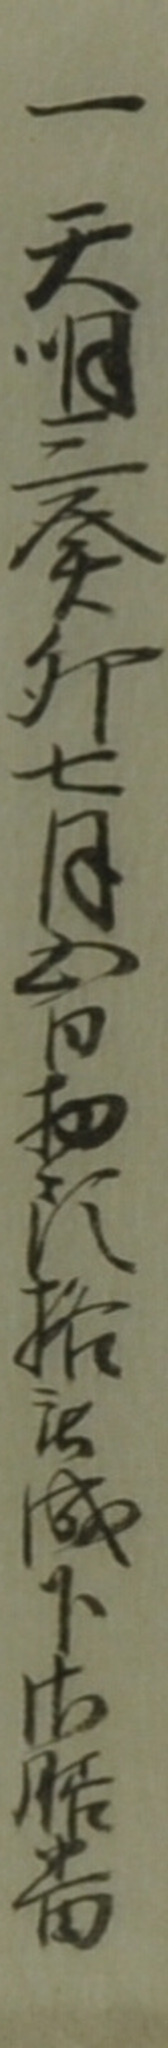一天明三癸卯七月五日物頭格被成下御膳番
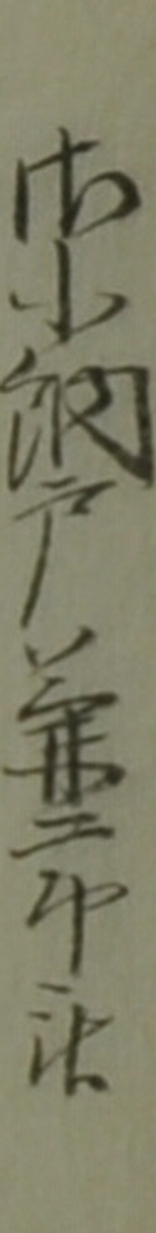御小納戸兼帯被
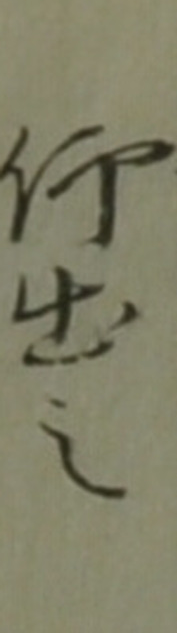仰出之
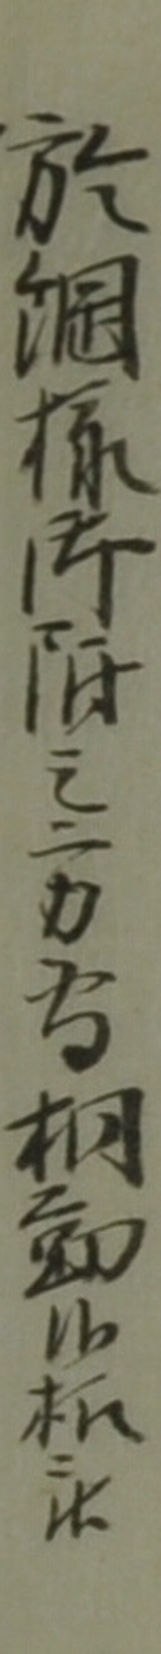於鋼様御附之方専相勤候様被
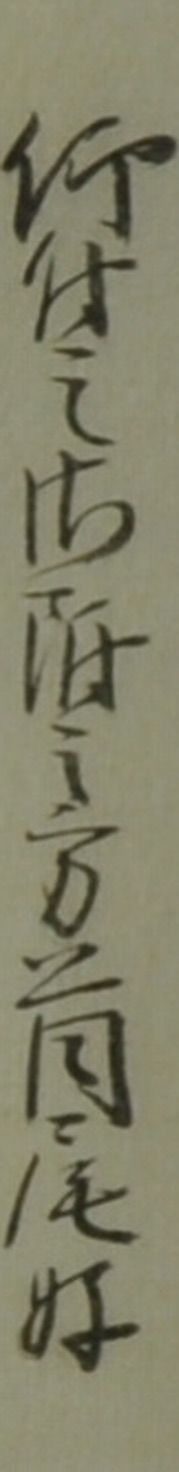仰付之御附之方首尾好

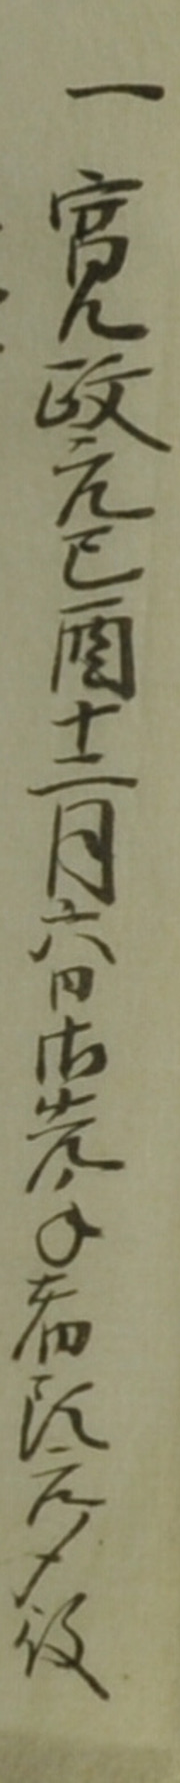一寛政元己酉十二月六日御先手者頭元〆役
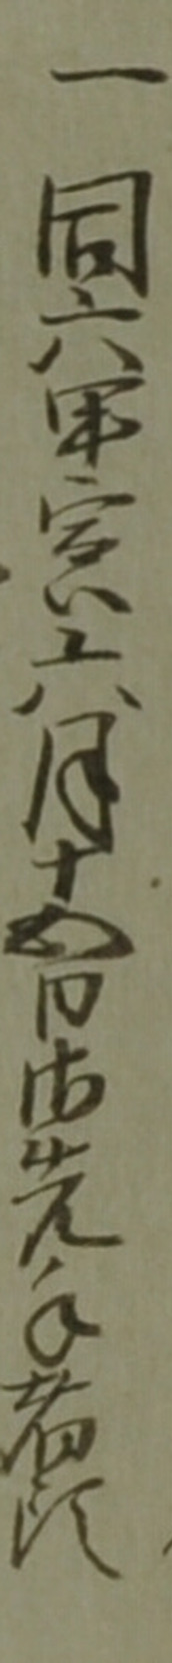一同六甲寅六月十五日御先手者頭
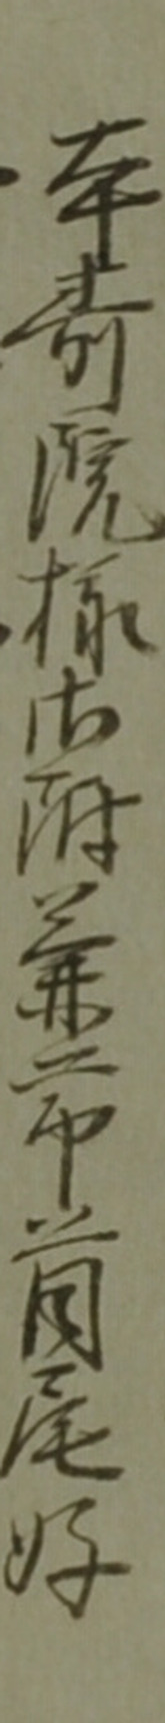本寿院様御附兼帯首尾好
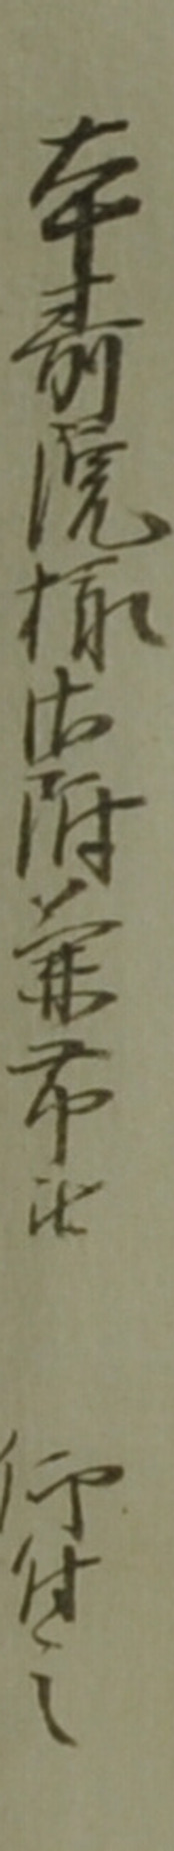本寿院様御附兼帯被仰付之
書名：諸御役代々録（六）
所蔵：伊那市立高遠町図書館・合同会社AMANE
